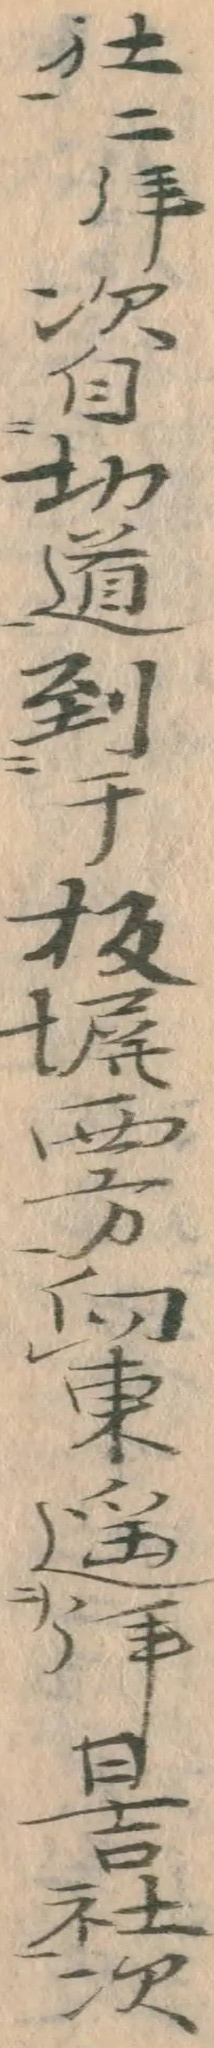社二拝次自切道到于板塀西方向東遥拝日吉社次
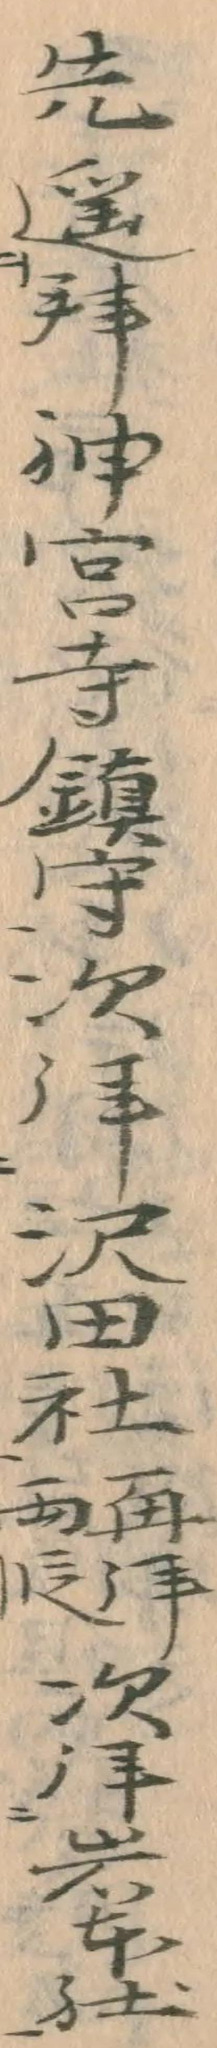先遥拝神宮寺鎮守次拝沢田社再拝両段次拝岩本社
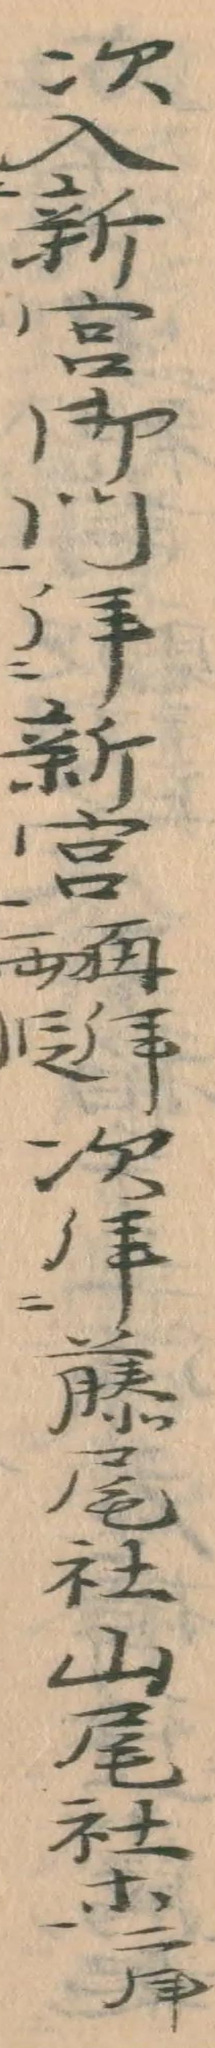次入新宮御門拝新宮再拝両段次拝藤尾社山尾社等二拝
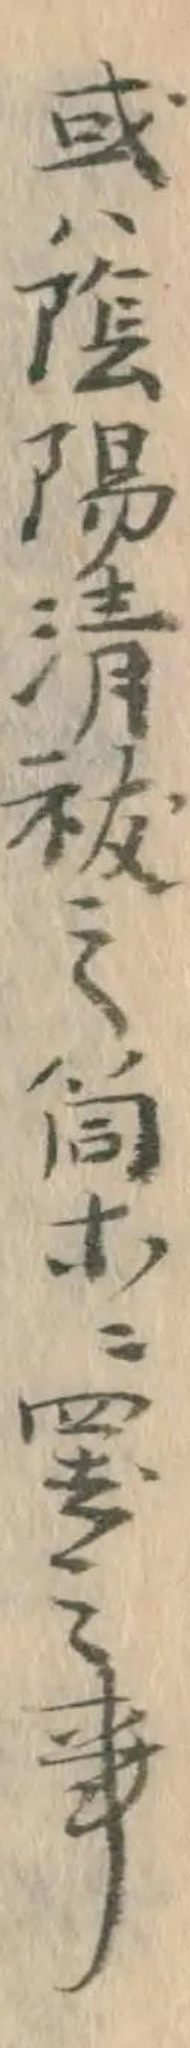或ハ陰陽清祓之筒等ニ置之事

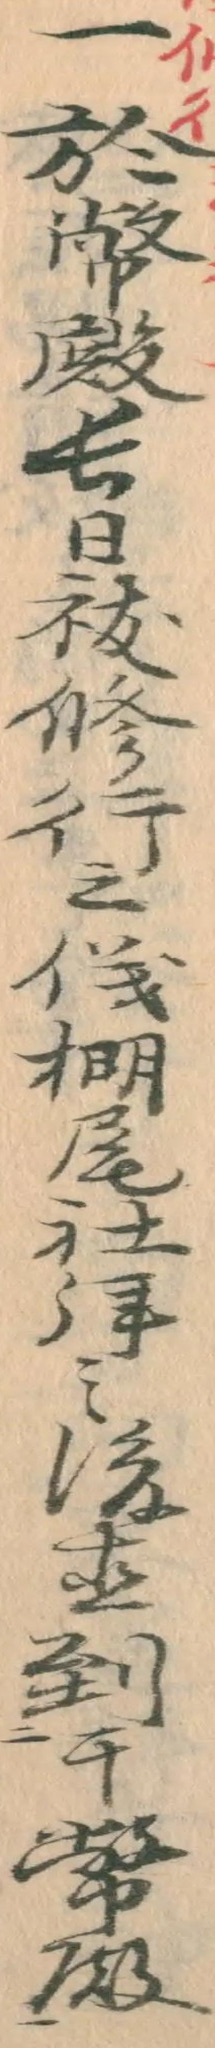一於幣殿長日祓修行之儀棚尾社拝之後直到于幣殿
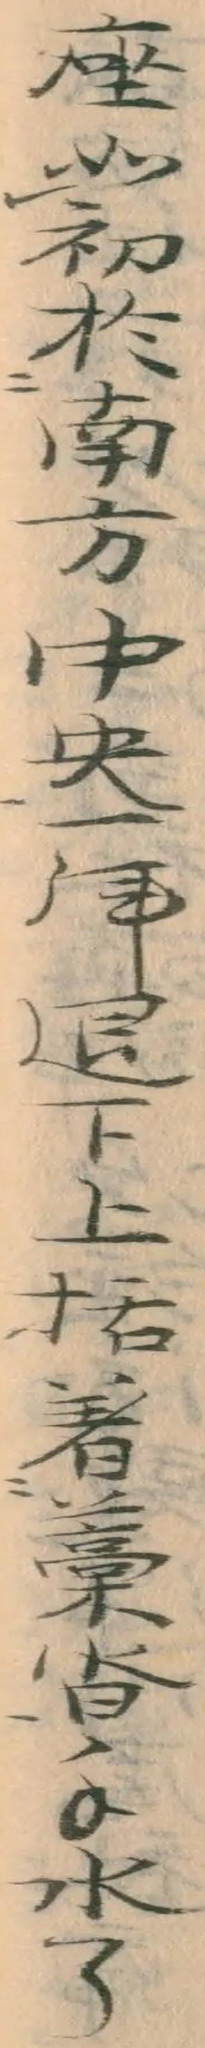座如初於南方中央一拝退下上括着藁沓手水了
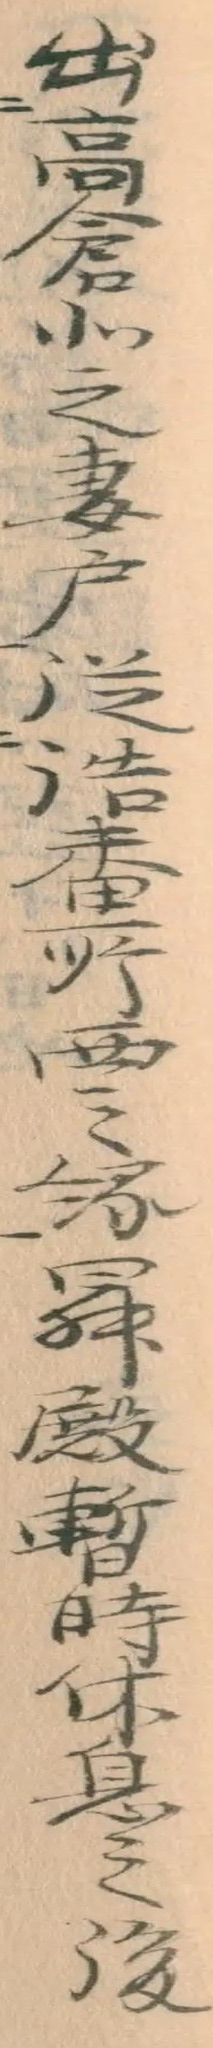出高倉北之妻戸従詰番所西之縁昇殿暫時休息之後
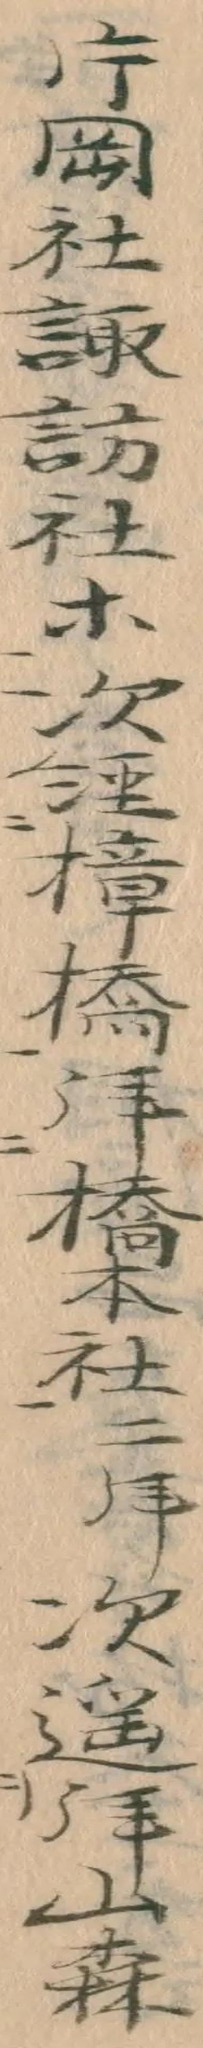片岡社諏訪社等次経樟橋拝橋本社ニ拝次遥拝山森
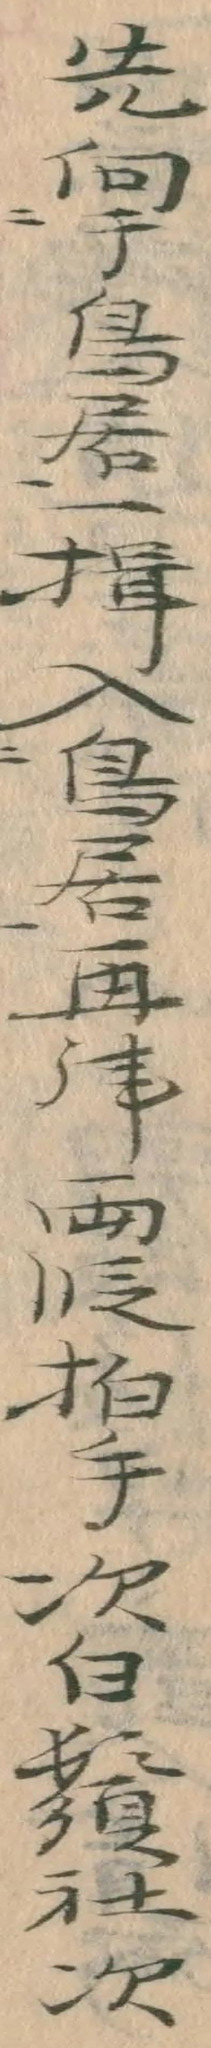先向于鳥居一揖入鳥居再拝両段拍手次白髪社次
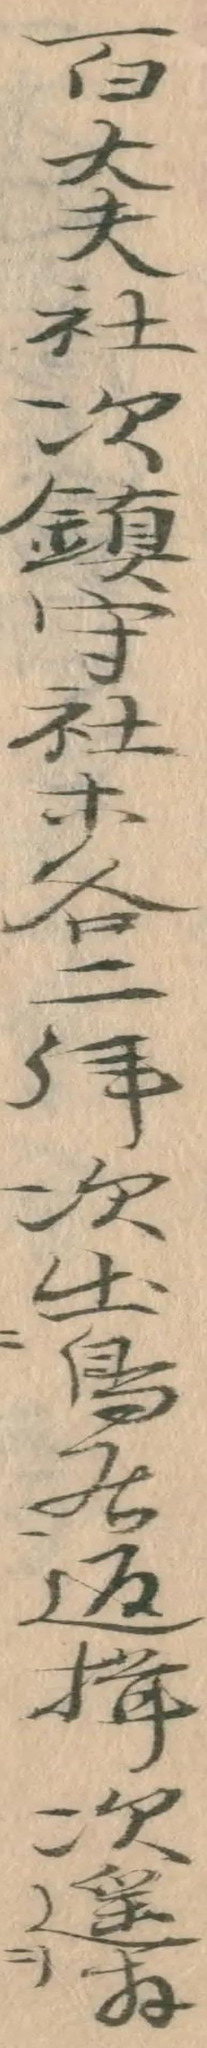百大夫社次鎮守社等各二拝次出鳥居返揖次遥拝
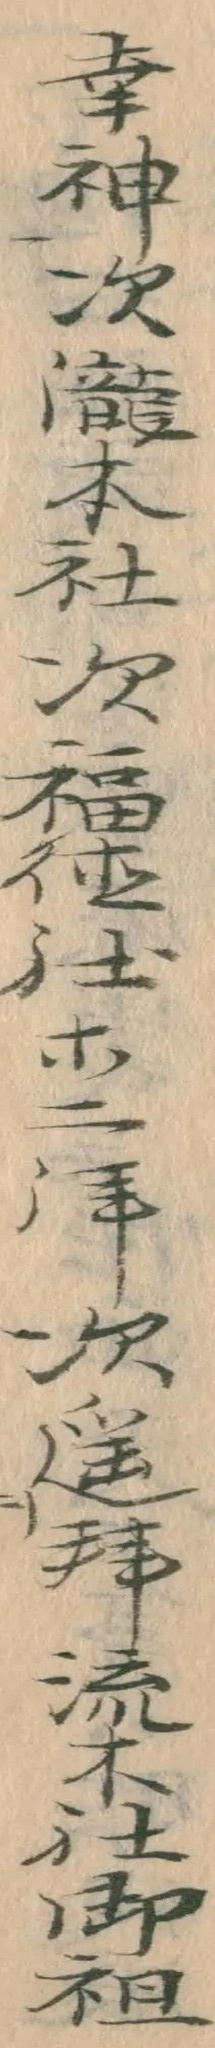幸神次瀧本社次福徳社等二拝次遥拝流木社御祖
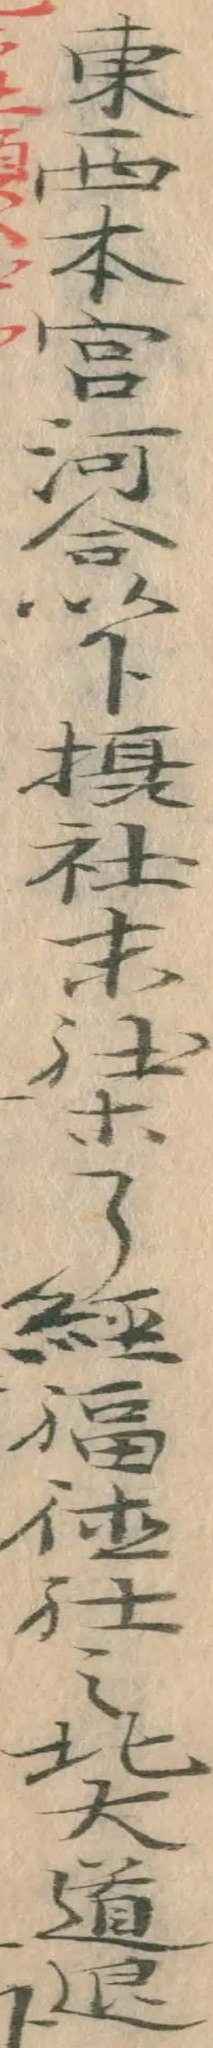東西本宮河合以下摂社末社等了経福徳社之北大道退下
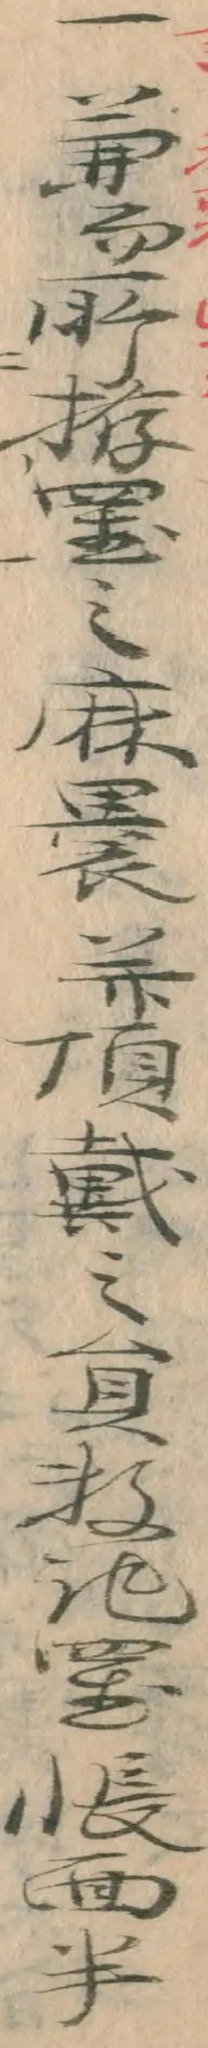一兼而所拵置之麻包并頂戴之員数記置帳面半

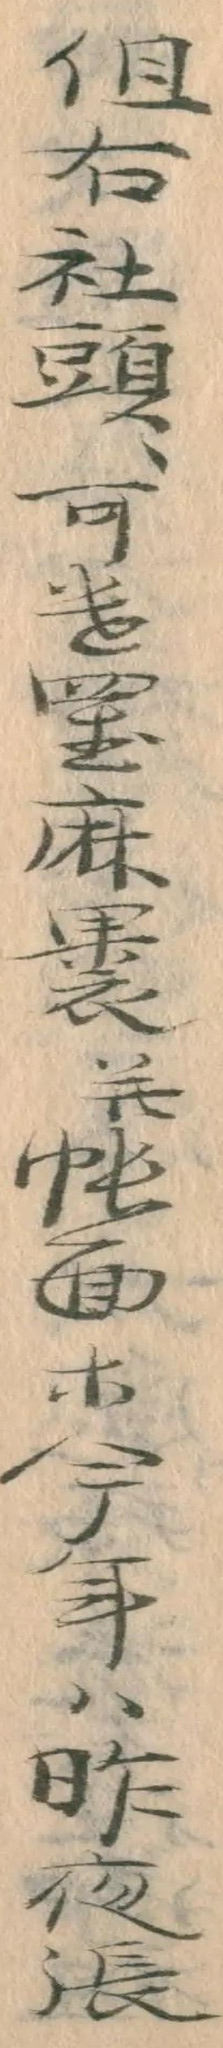但右社頭ヘ可遣置麻包并帳面等今年ハ昨夜張
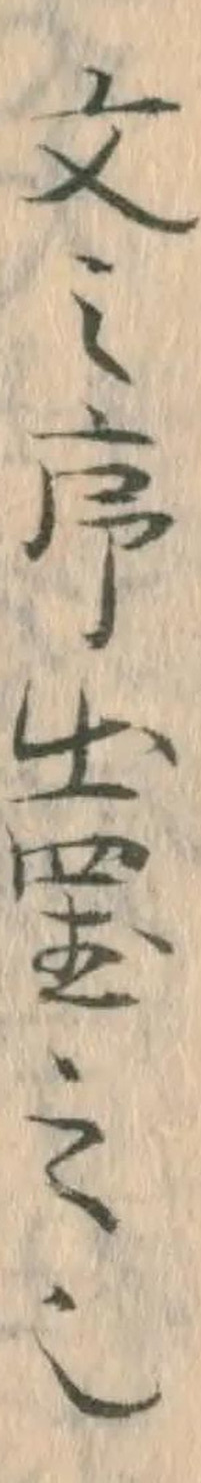文之序出置之也
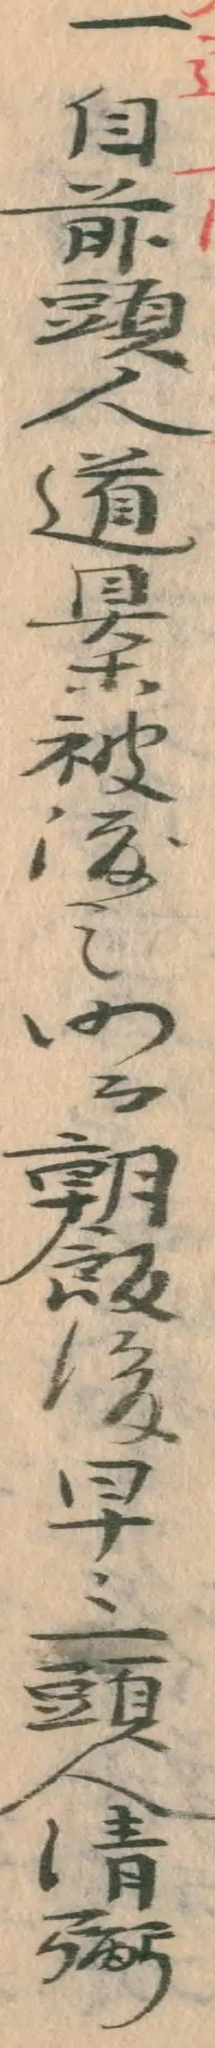一自前頭人道具等被渡之仍而朝飯後早〻一頭人清弼
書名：賀茂社記録. 第72冊
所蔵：国立国会図書館 National Diet Library, JAPAN
